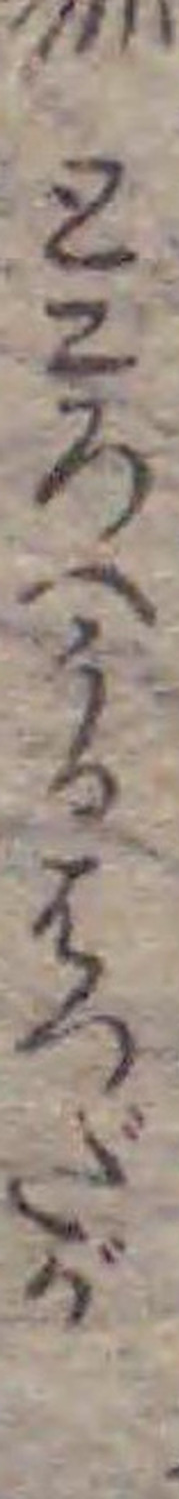ところへうるはつだが
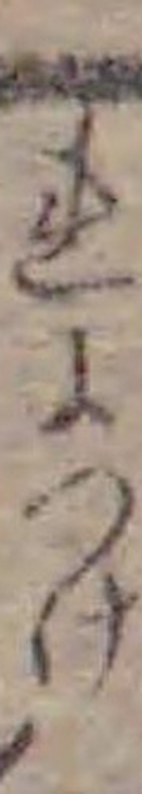れにつけ
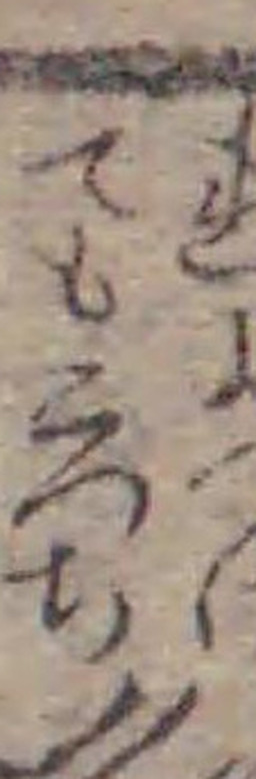てもこつち
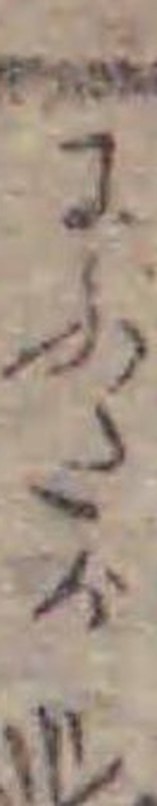にふたが
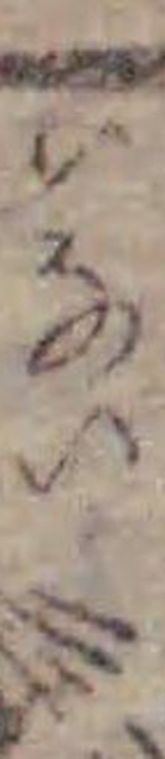いない
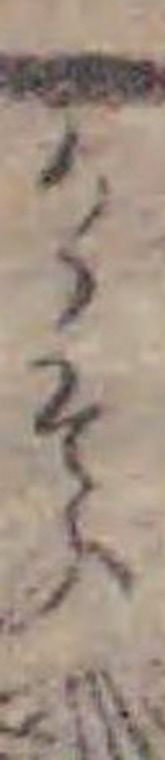からそふ
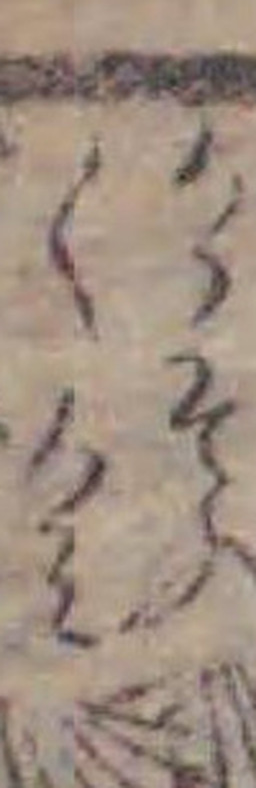〳〵かみ
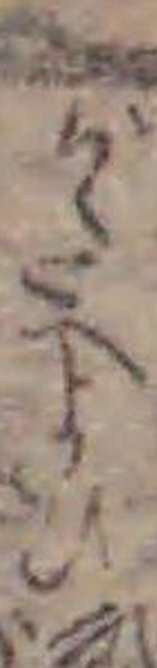がたへよび

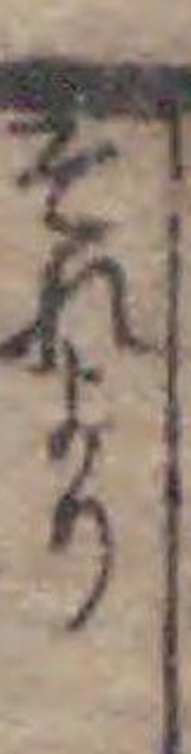それより
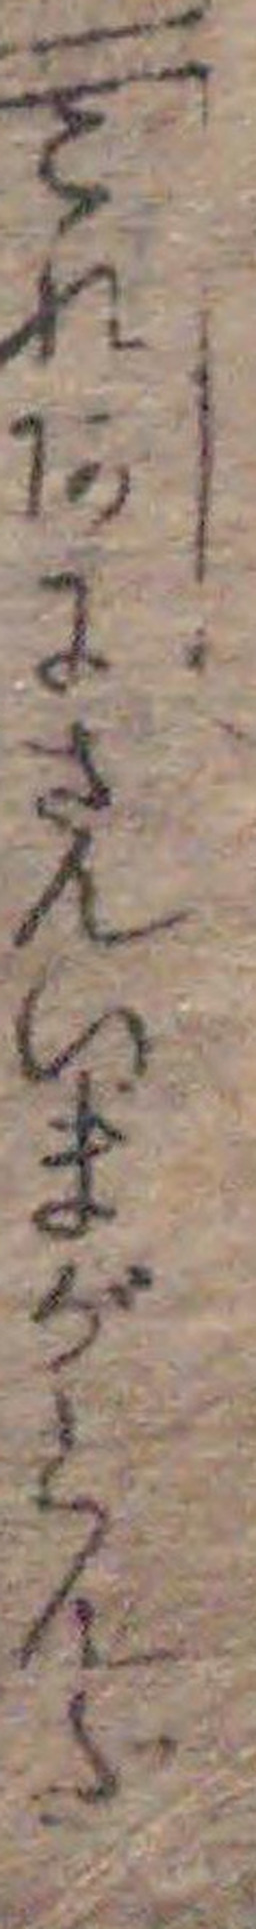これあにさんいまがとんだ
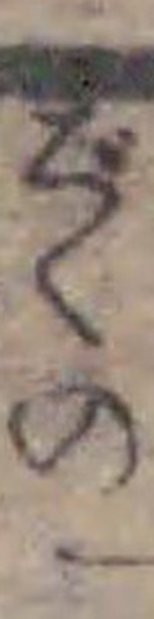ごくの
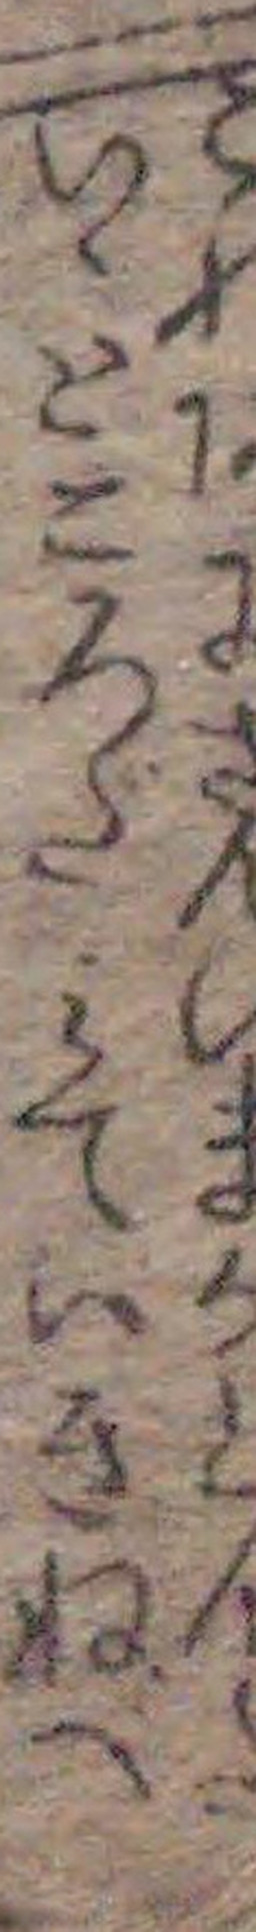いゝところだみていきねへ
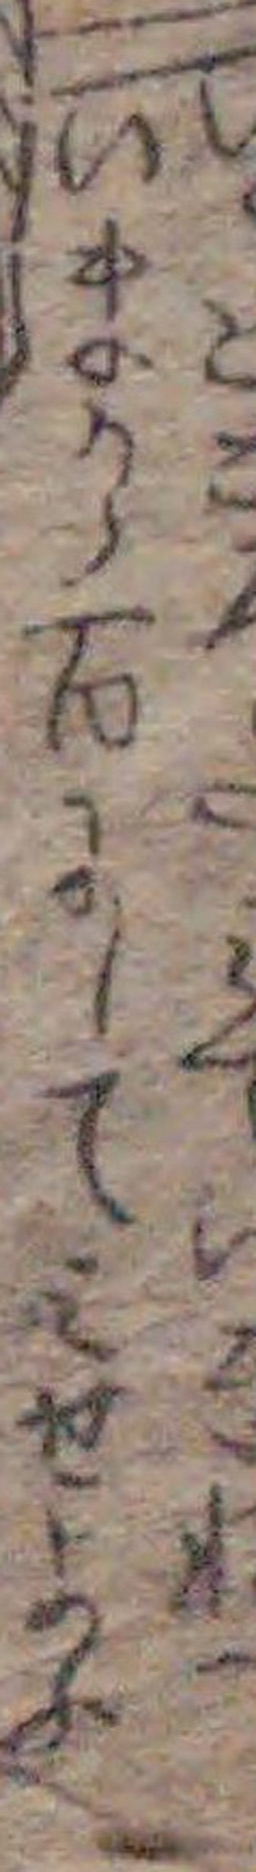いまから百にしてみせよふ
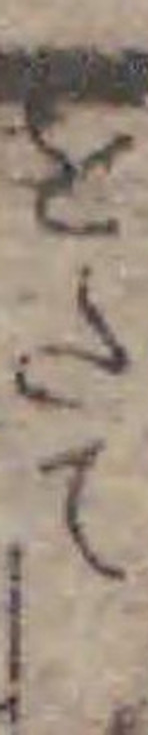をたて
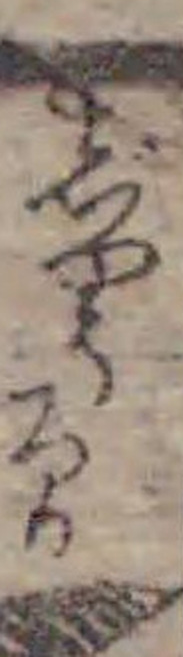じやうるり
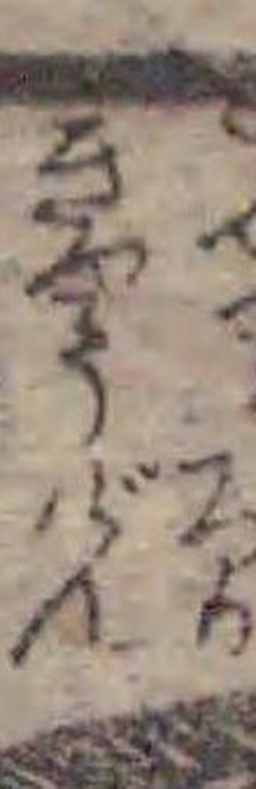きやうげん
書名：化物七段目 : 2巻
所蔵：国立国会図書館 National Diet Library, JAPAN
